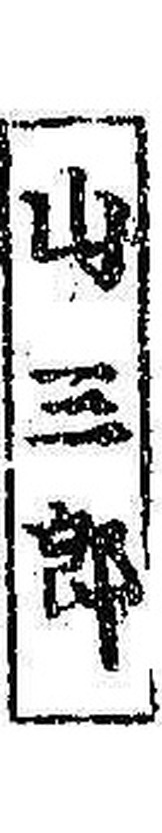山三郎
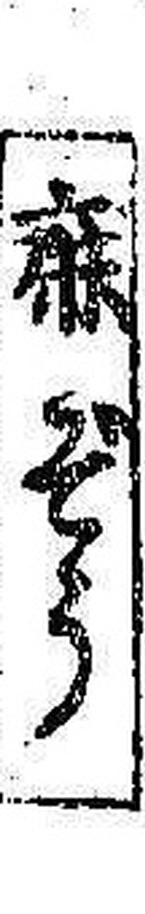鹿ぞう

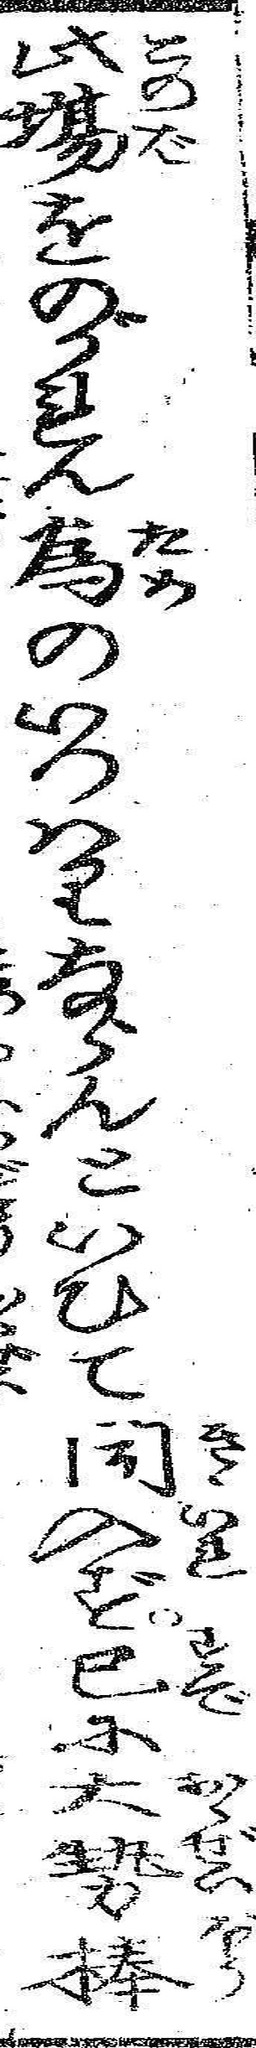此場をのがれん為のいつはりならんといひて聞入ず。已に大勢棒
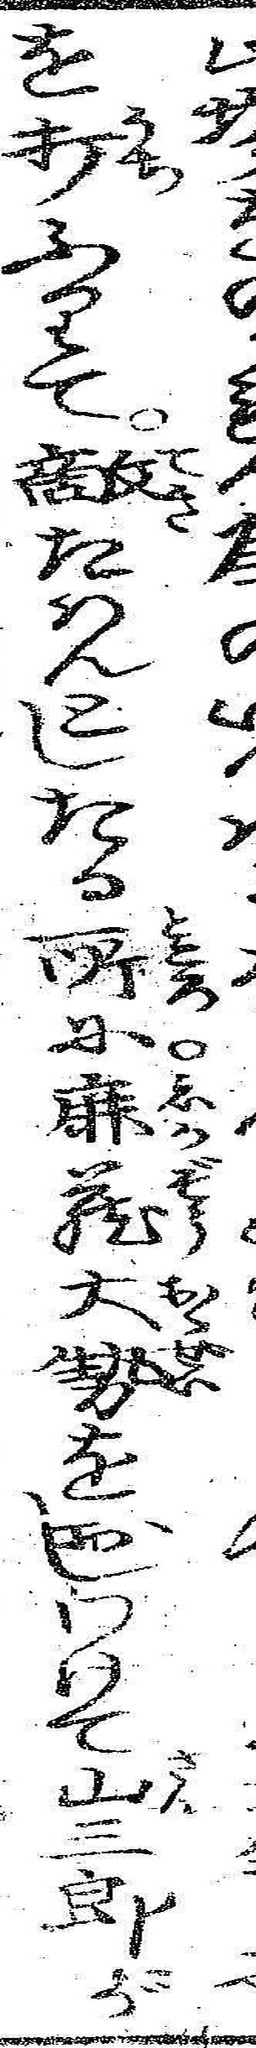を打ふりて。敵たはんとしたる所に。鹿蔵大勢をおしわけて山三郎が
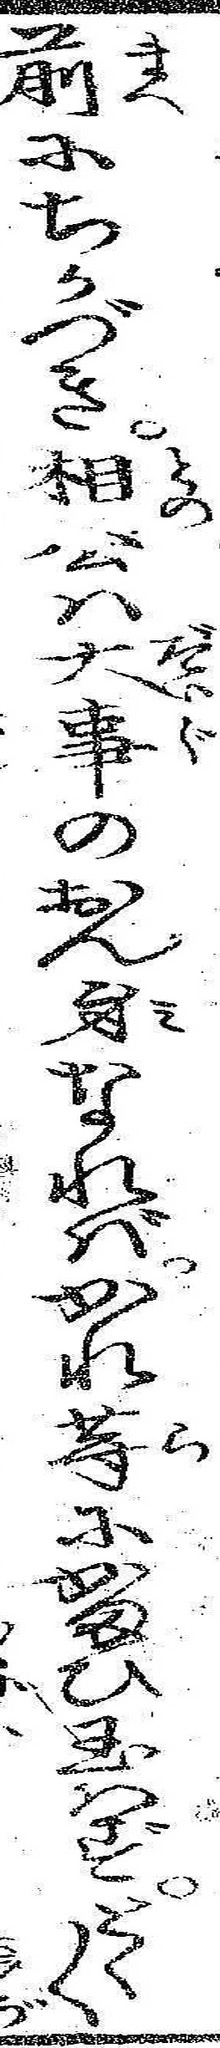前にちかづき。相公は大事のおん身なれば。かれ等にかまひ玉はず。とく〳〵
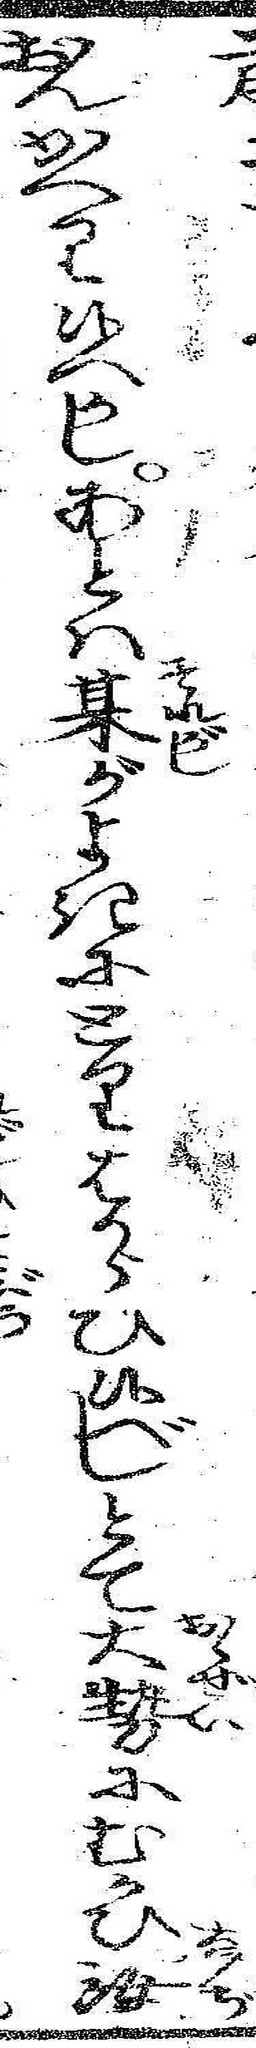おんかへり候へかし。あとは某がよきにとりはからひ候べしとて大勢にむかひ。汝
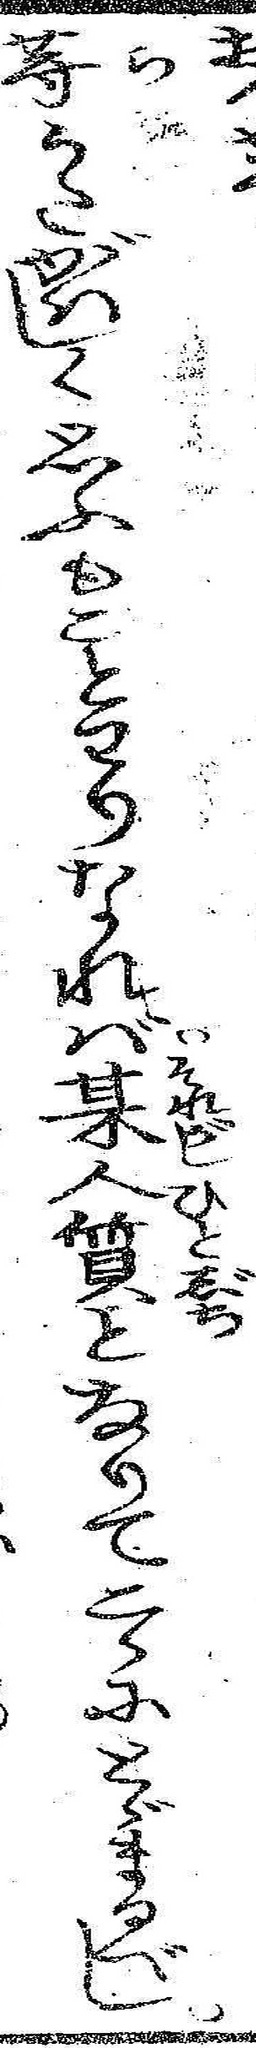等かたがはしく思ふもことわりなれば。某人質となりてこゝにとゞまるべし。
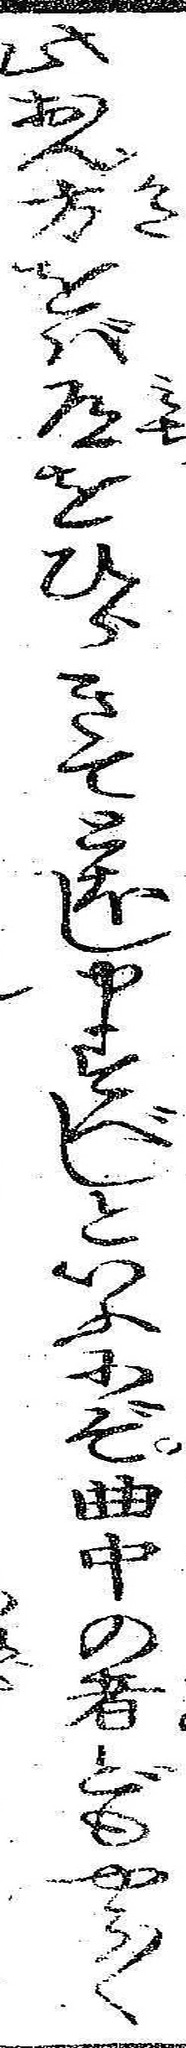此おん方をば道をひらきてとほし申すべしといふにぞ。曲中の者どもやう〳〵
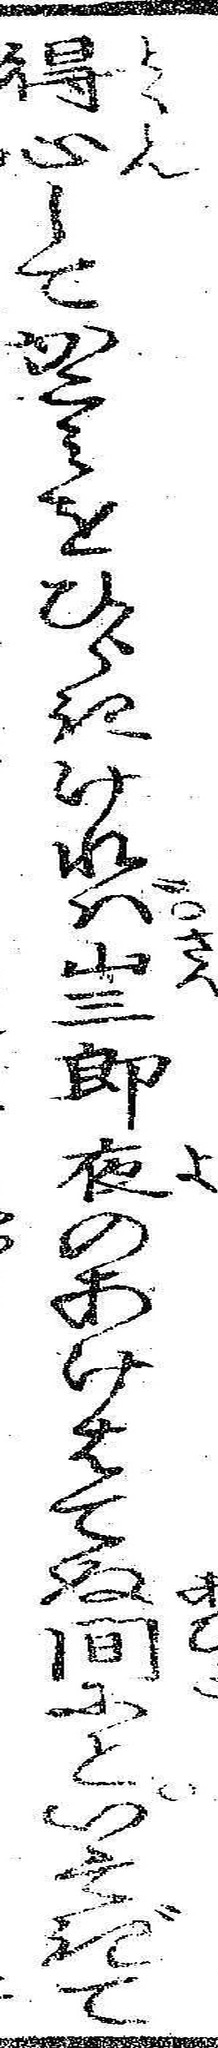得心してかこみをひらきければ。山三郎夜のあけはてぬ間にと。いそぎて
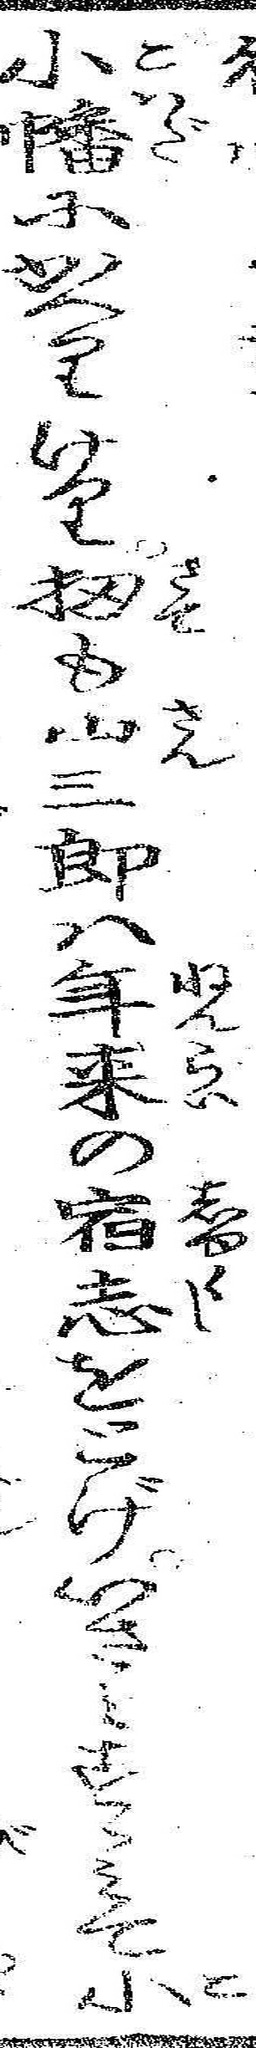小幡にかへりけり。扨も山三郎は年来の宿志をとげ。いさみすゝみて小
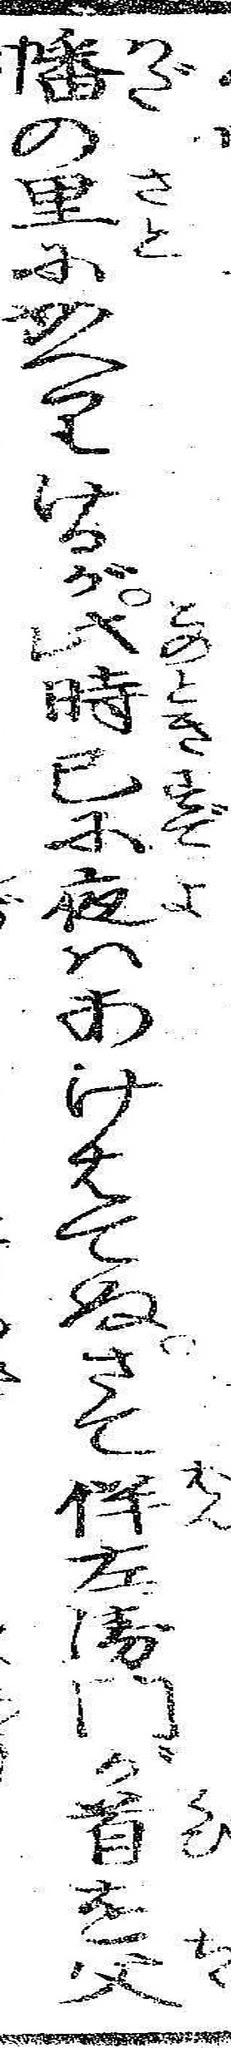幡の里にかへりけるが。此時已に夜はあけはてぬ。さて伴左衛門が首を父
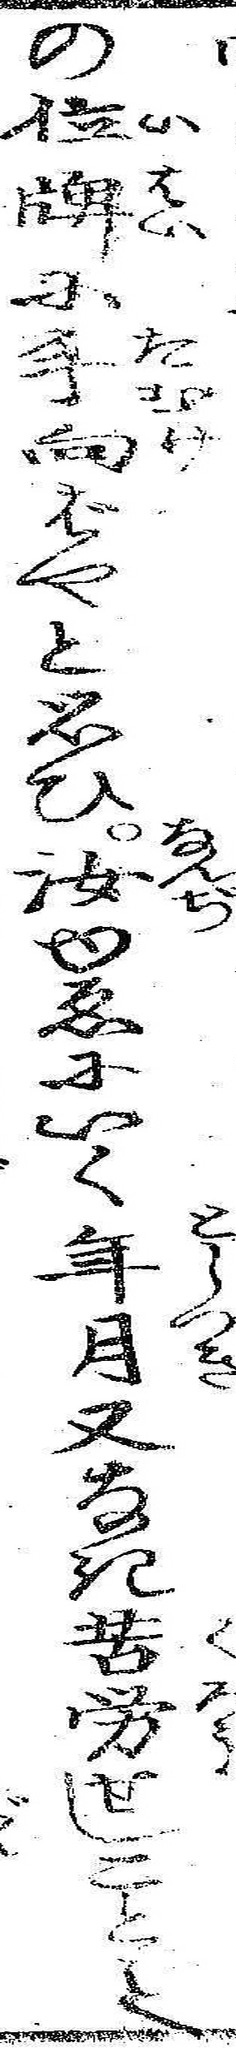の位牌に手向ばやと思ひ。汝ゆゑにいく年月又なき苦労せしことよ
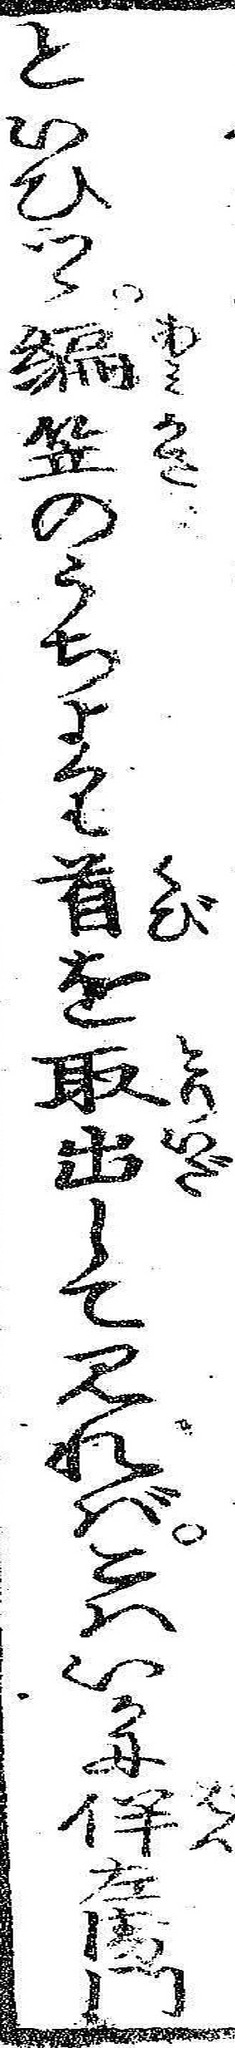といひつゝ。編笠のうちより首を取出して見れば。こはいかに伴左衛門
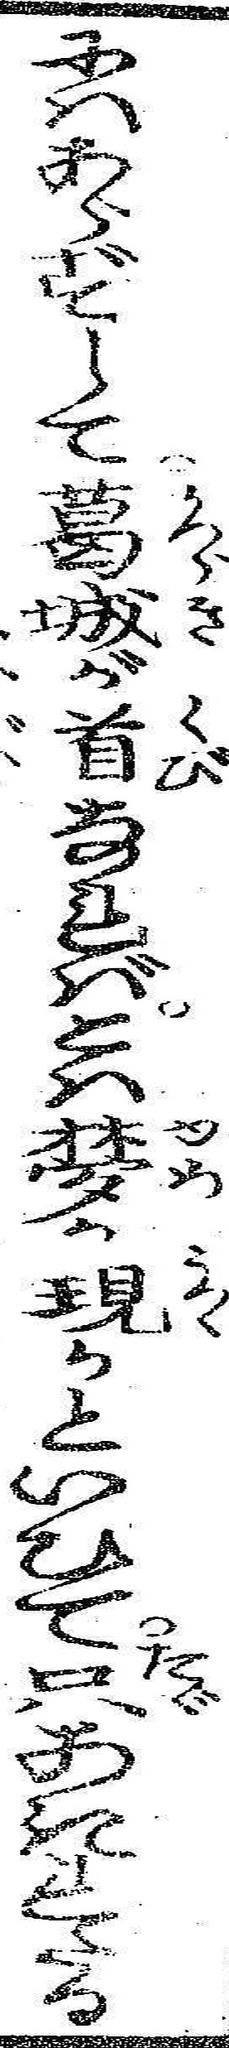にはあらずして。葛城が首なれば。こは夢か現かといひて。只あきれたる
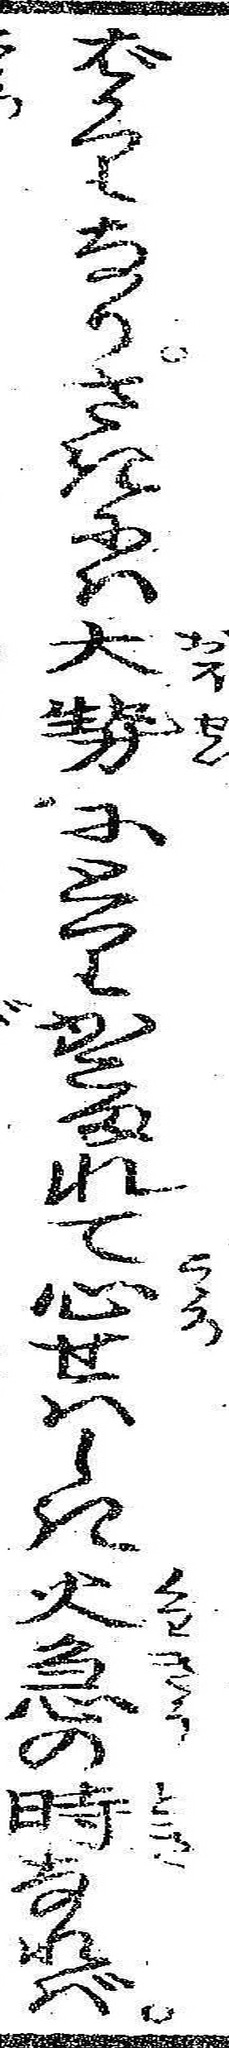ばかりなり。さきには大勢にとりかこまれて心せはしき火急の時なれば。
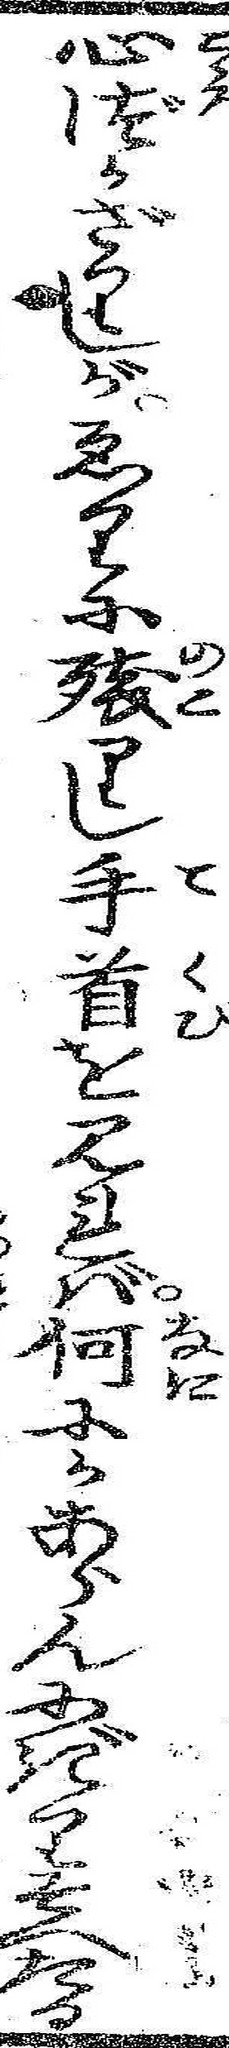心づかざりしが。ゑりに残りし手首を見れば。何にかあらんにぎりそへたる
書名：昔話稲妻表紙
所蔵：国文学研究資料館
